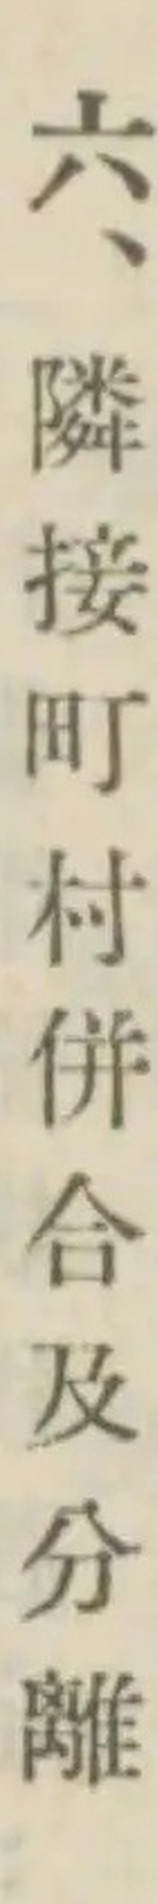六、隣接町村併合及分離
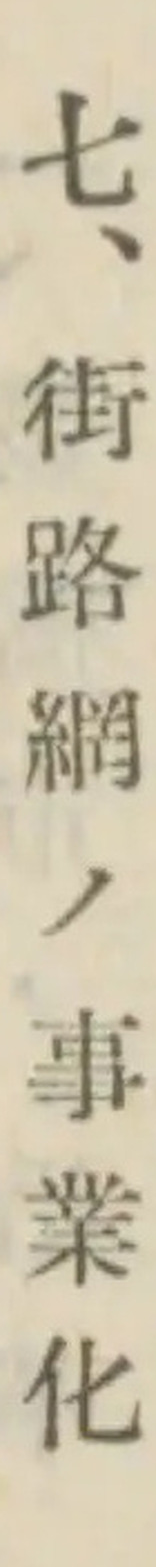七、街路網ノ事業化
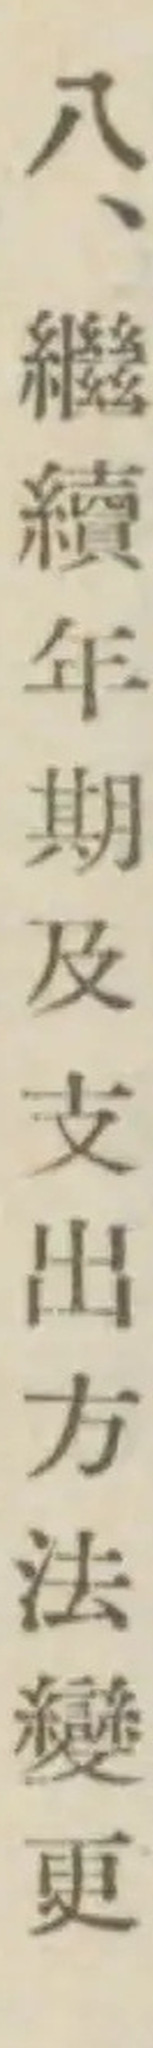八、継続年期及支出方法変更
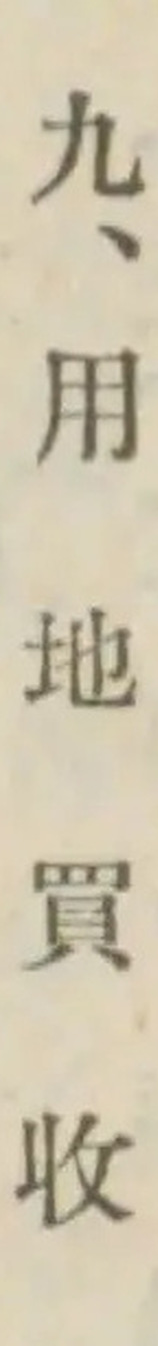九、用地買収
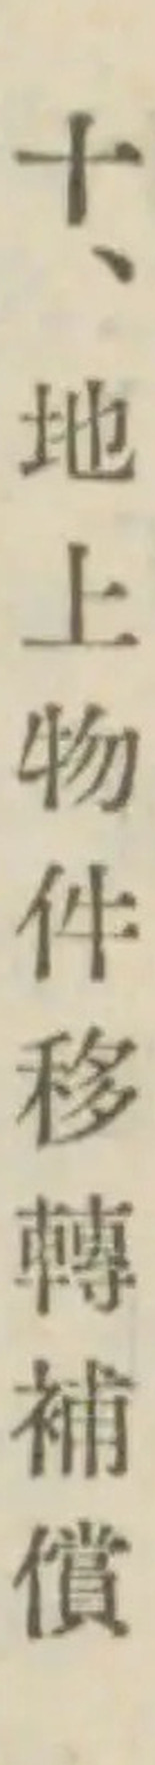十、地上物件移転補償
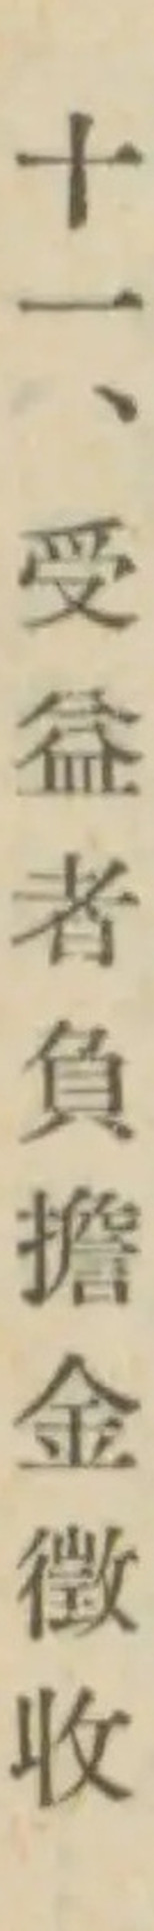十一、受益者負担金徴収

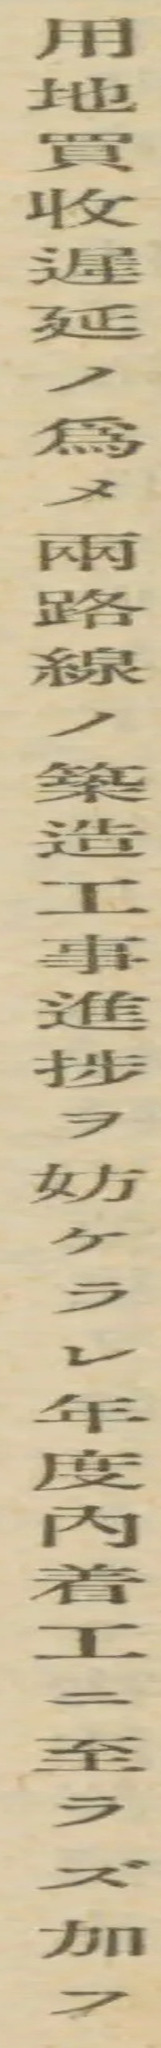用地買収遅延ノ為メ両路線ノ築造工事進歩ヲ妨ケラレ年度内着工ニ至ラズ加フ
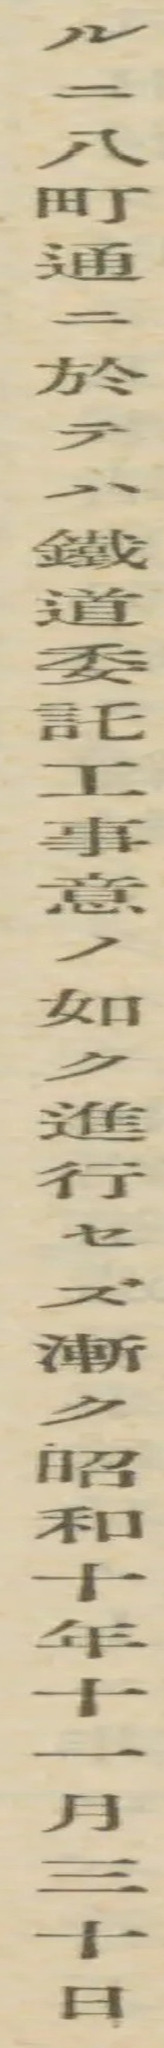ルニ八町通ニ於テハ鉄道委託工事意ノ如ク進行セズ漸ク昭和十年十一月三十日
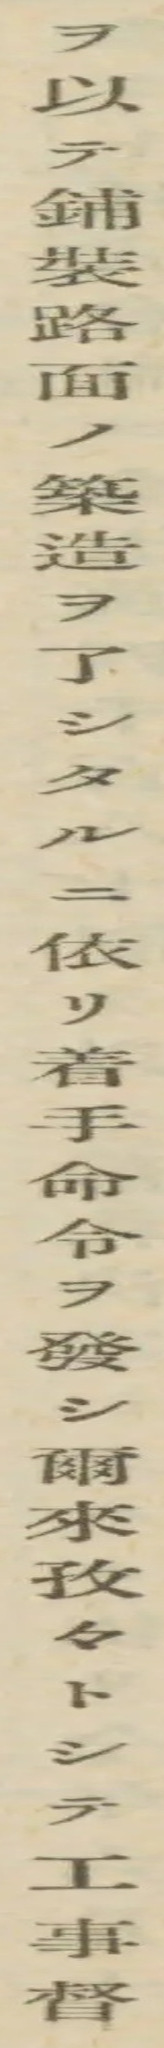ヲ以テ舗装路面ノ築造ヲ了シタルニ依リ着手命令ヲ発シ爾来孜々トシテ工事督
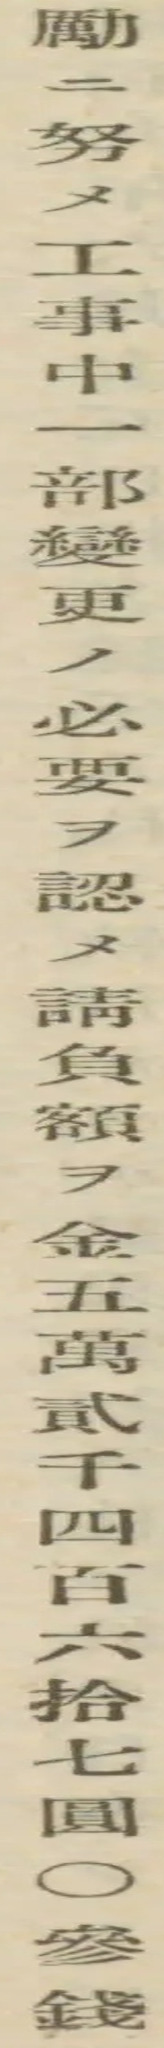励ニ努メ工事中一部変更ノ必要ヲ認メ請負額ヲ金五万二千四百六十七円○三銭
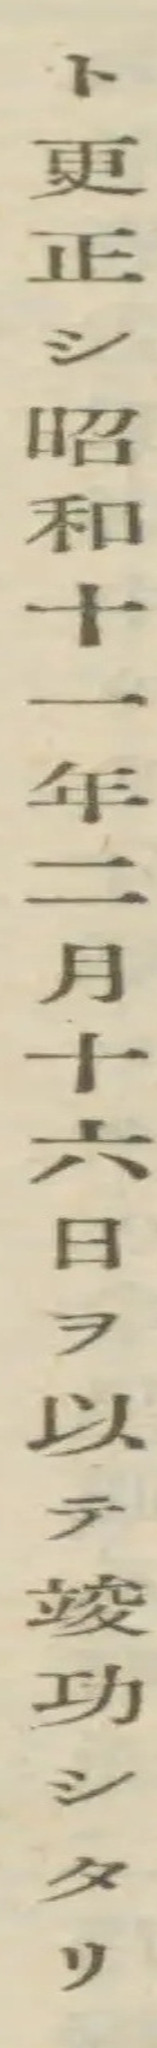ト更正シ昭和十一年二月十六日ヲ以テ竣功シタリ
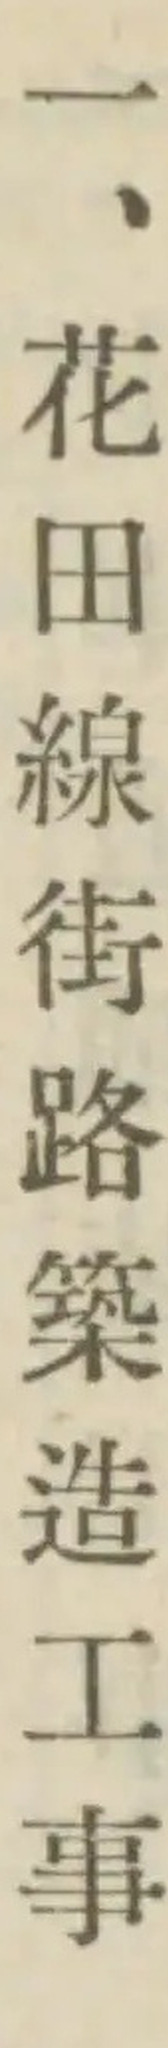一、花田線街路築造工事
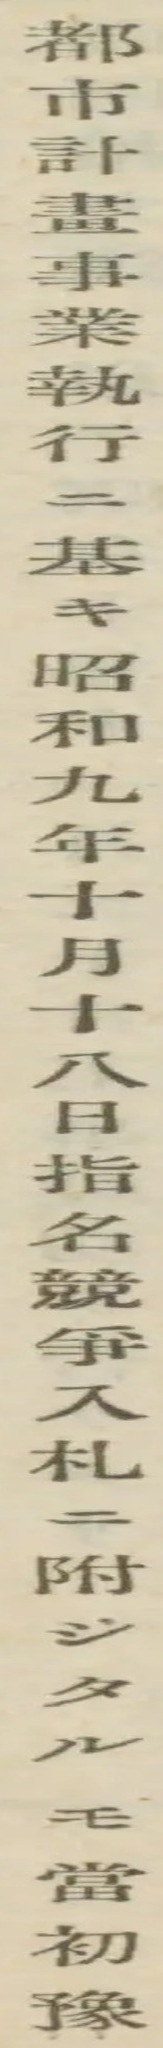都市計画事業執行ニ基気キ昭和九年十月十八日指名競争入札ニ付シタルモ当初予
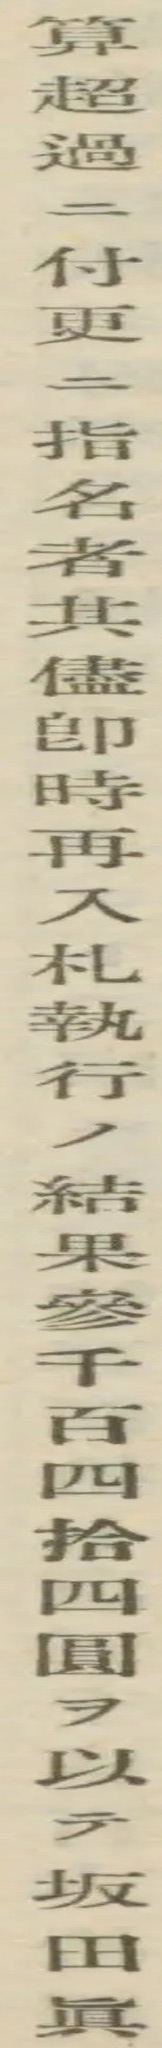算超過ニ付更ニ指名者其儘即時再入札執行ノ結果三千百四十四円以テ坂田真
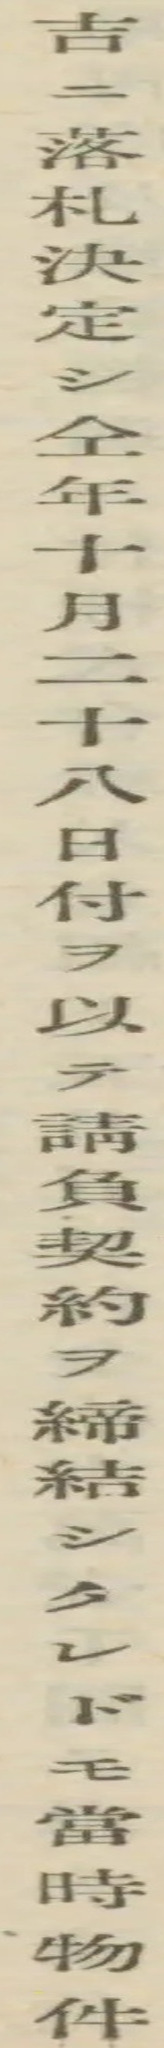吉ニ落札決定シ仝年十月二十八日付ヲ以テ請負契約ヲ締結シタレドモ当時物件
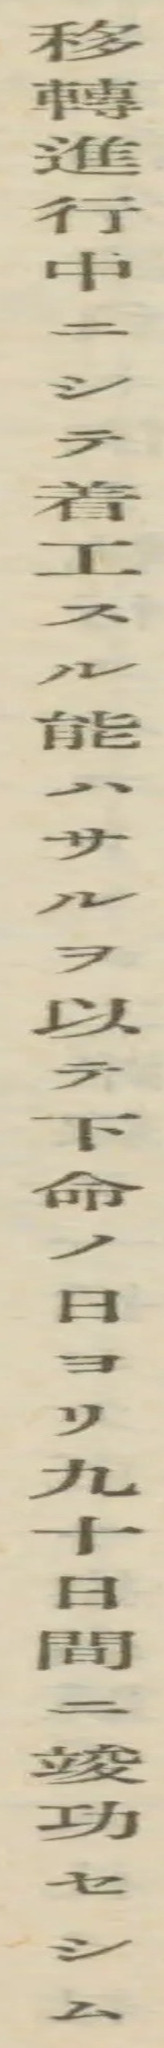移転進行中ニシテ着工スル能ハサルヲ以テ下命ノ日ヨリ九十日間ニ竣工セシム
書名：豊橋市都市計画第一期事業報告書
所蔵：国立国会図書館 National Diet Library, JAPAN
